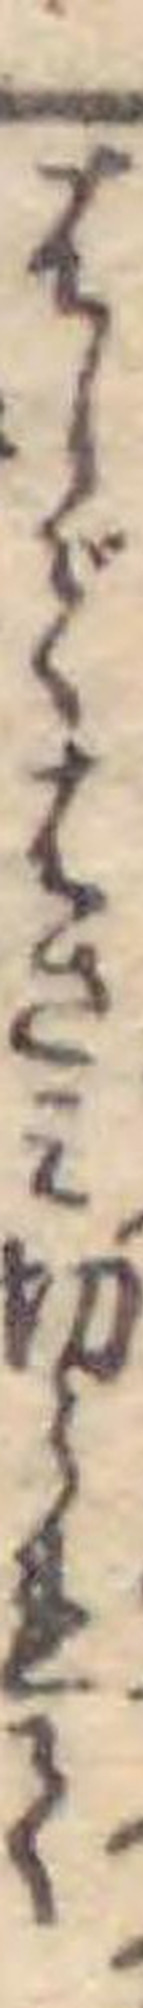はしではさみきられて
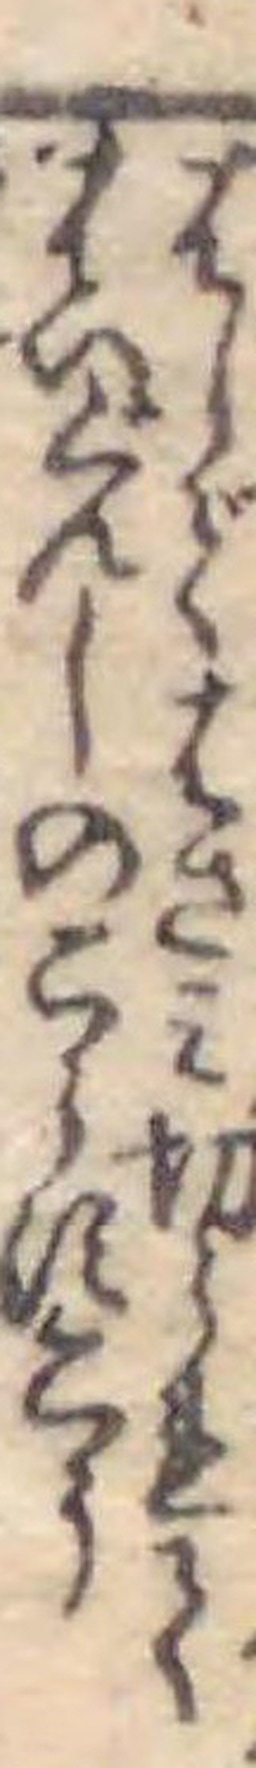はいぐんしのこらすこう
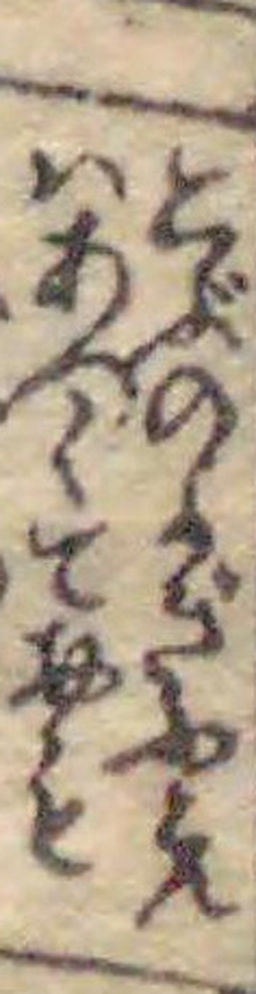はあつくておも
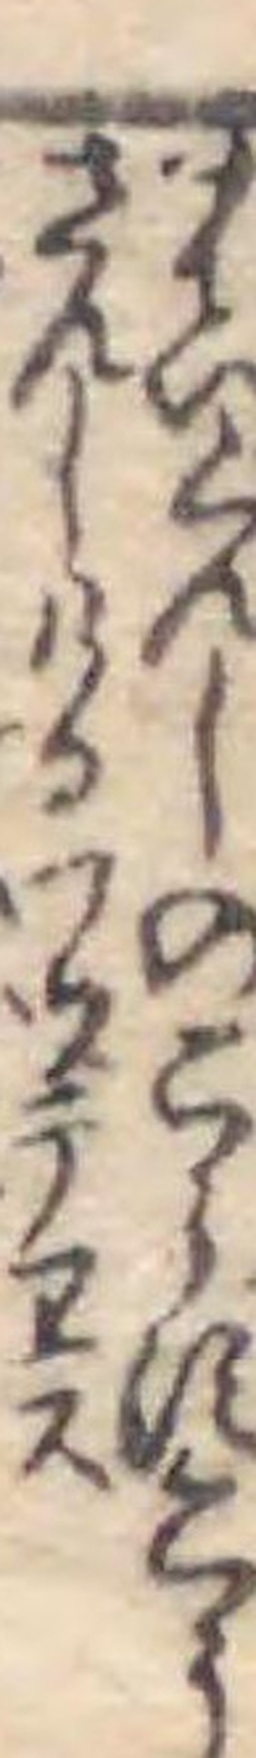さんしけるフツテヱス
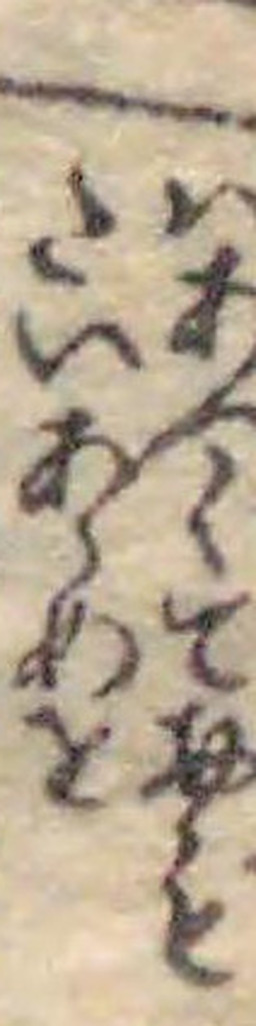たいあらめを
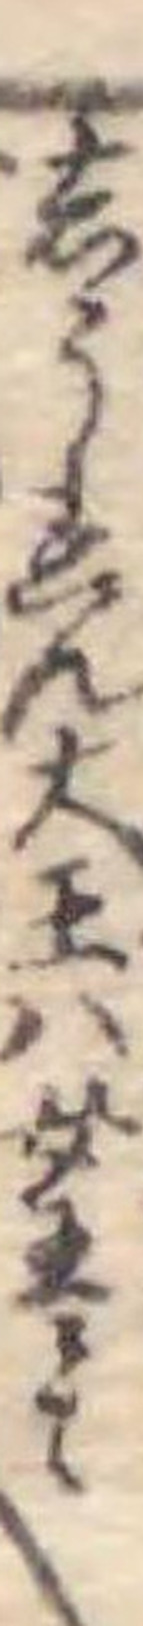しうれん大王は女王にて
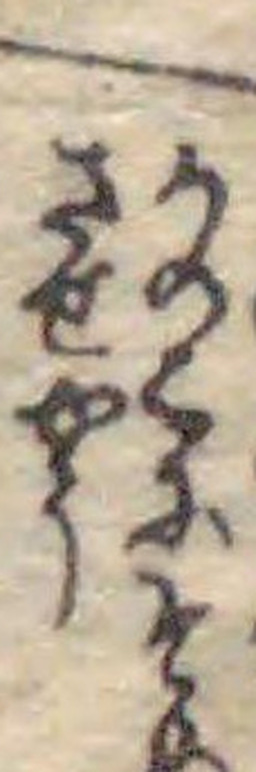させやう
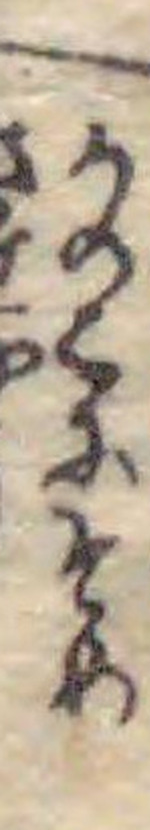かのこにそめ
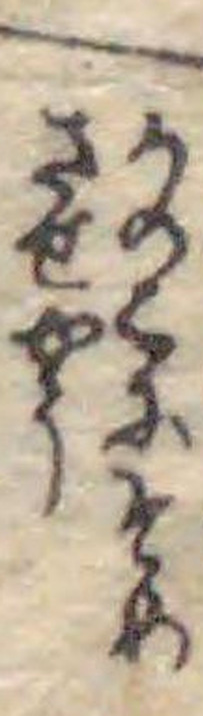させやう
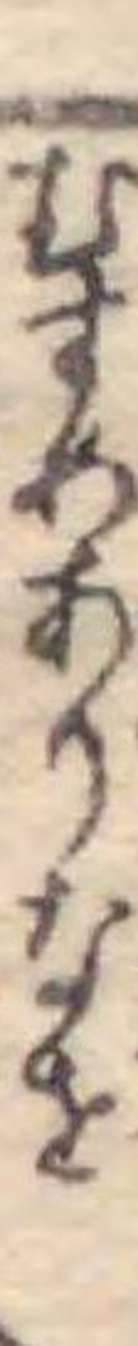むすめありなを
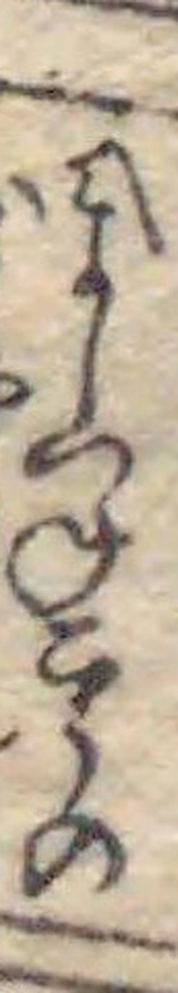〽よしつねこうの
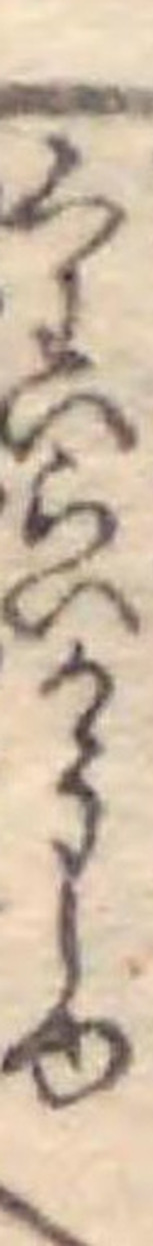くわいらいかうしゆ
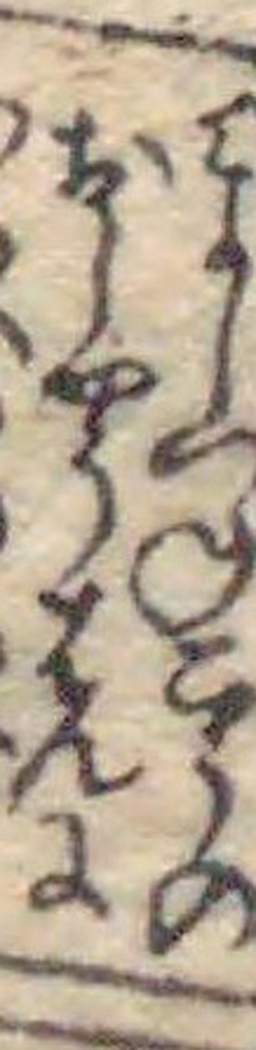おしやうはんに
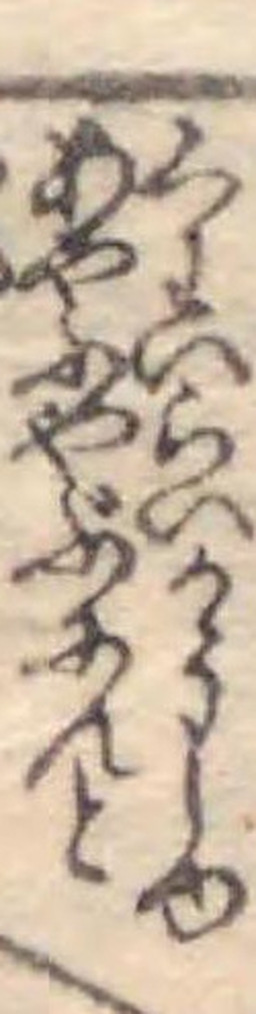あやふやぶにんと
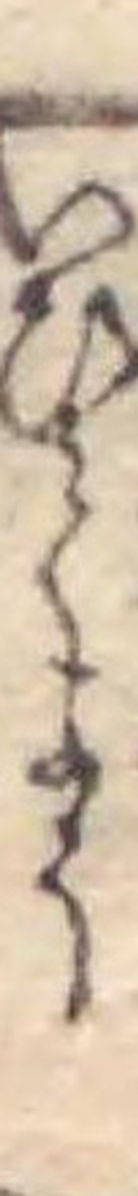いひてよう
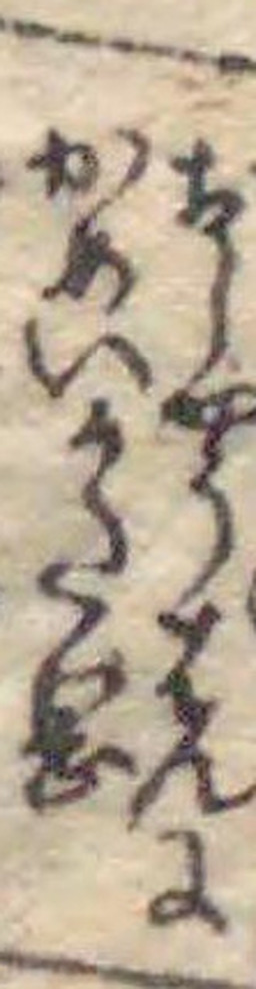かめいかた岡
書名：悦贔負蝦夷押領 : 3巻
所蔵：国立国会図書館 National Diet Library, JAPAN
